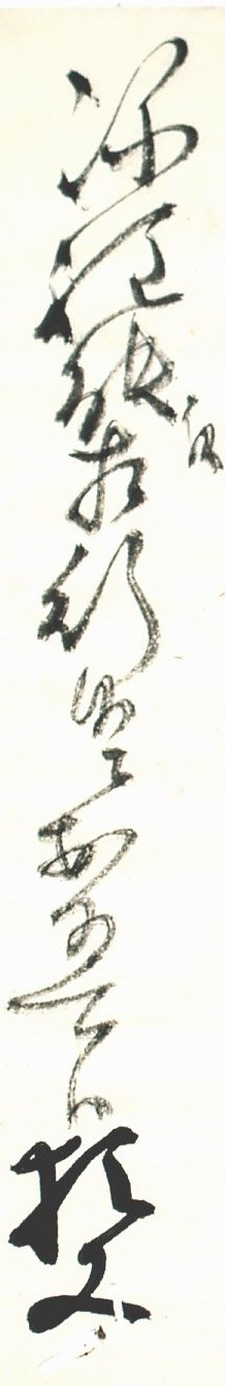弥程能被相行候におゐては猶又
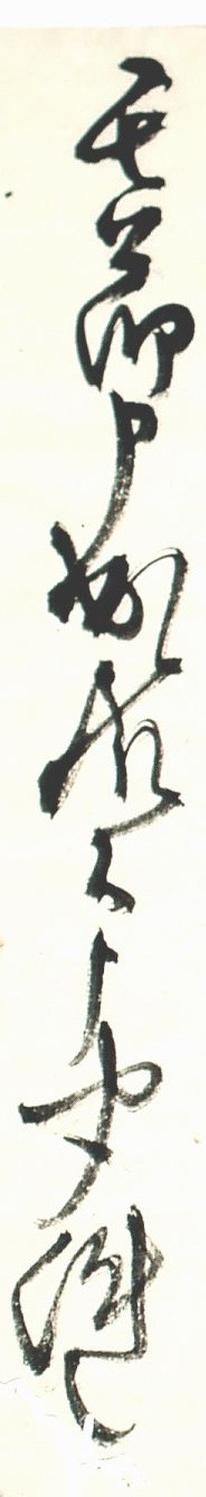其節申出候様被申聞件之
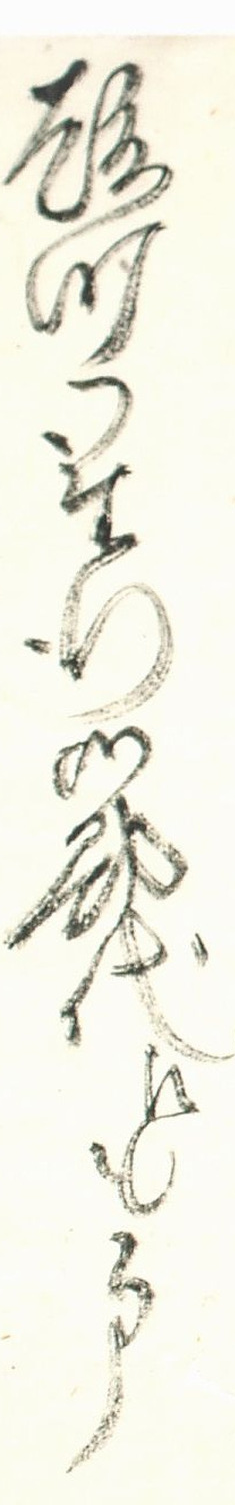趣町御奉行御郡代えも被申

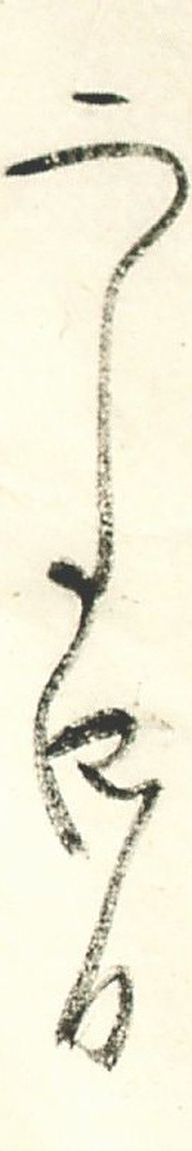二月四日
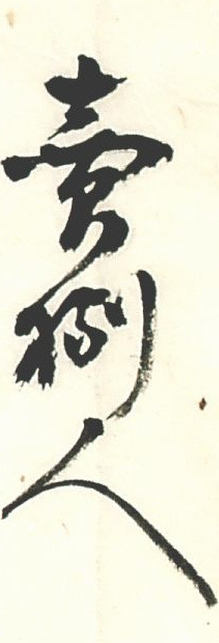売捌人
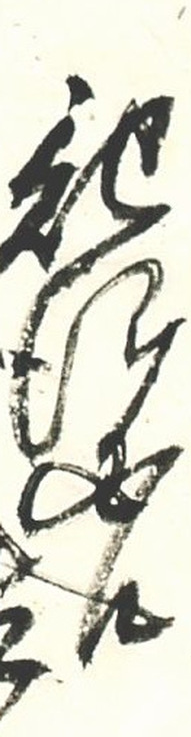紀伊国屋
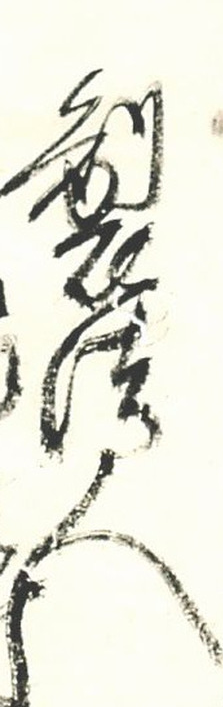製法人
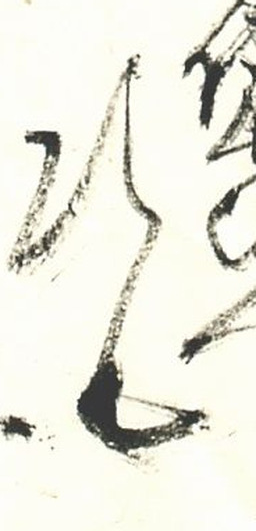次兵衛
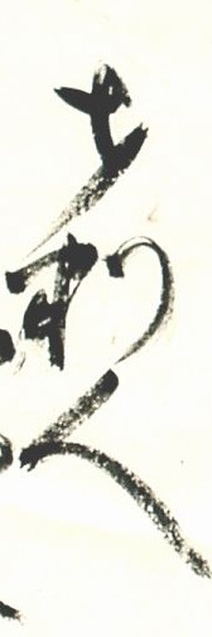才判人
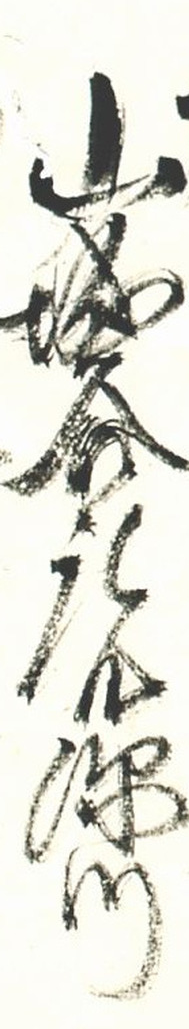山城谷庄屋深川
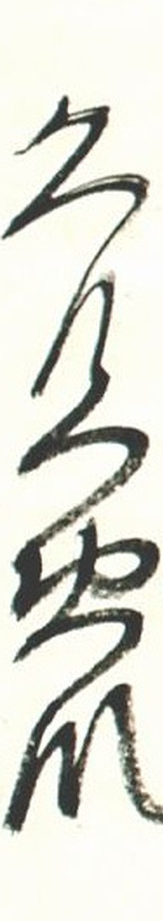久左衛門惣領
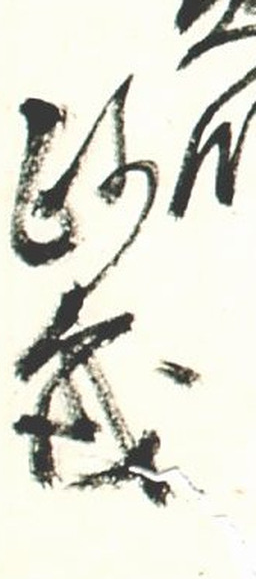徳兵衛
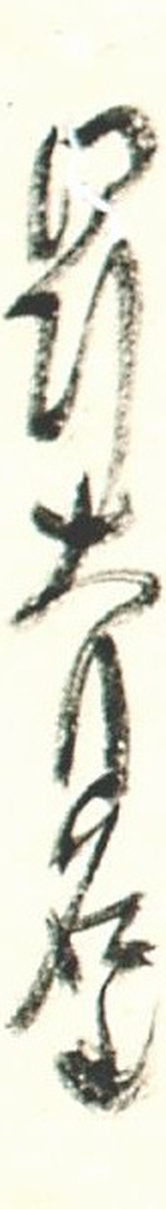同断大月名主
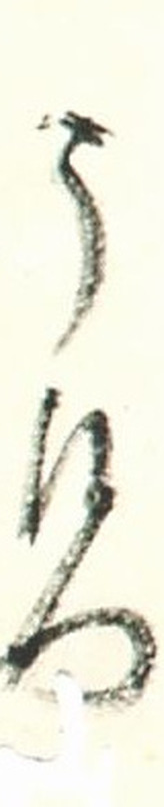寿左衛門
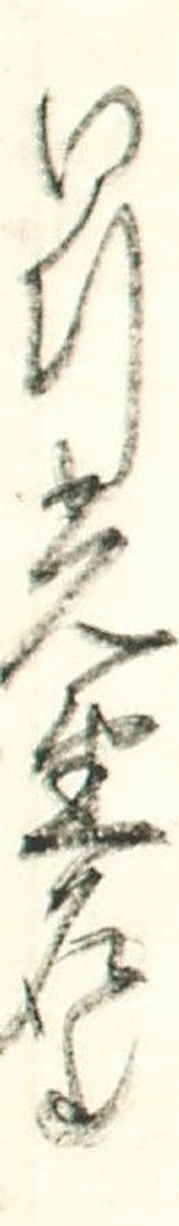同断大月名主

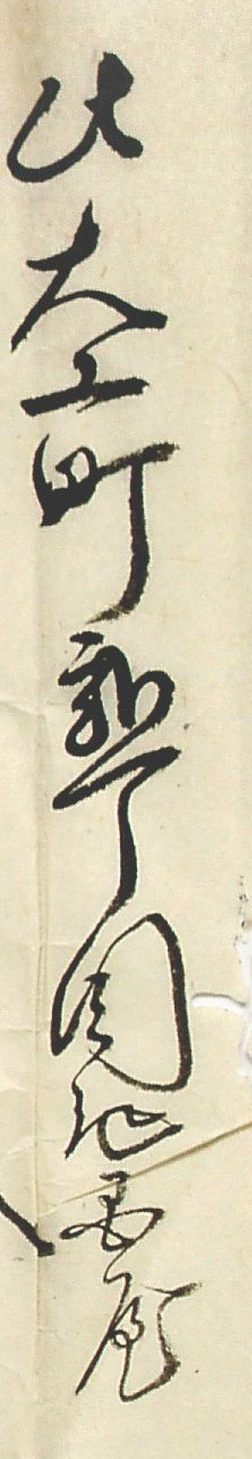此大工町弐丁目紀国屋
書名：申上覚（漆からろう製成及売捌きについて）
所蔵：鳴門教育大学 Naruto University of Education
